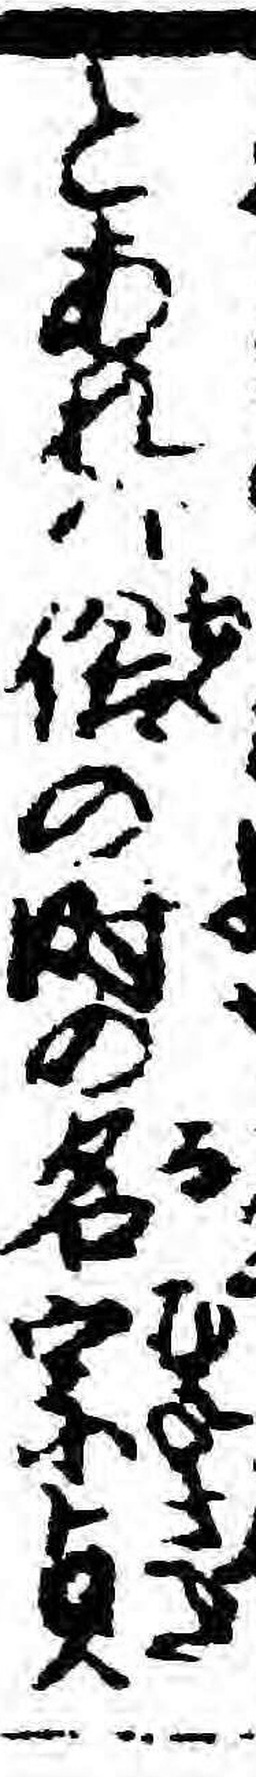とあれば俗の時の名宗貞
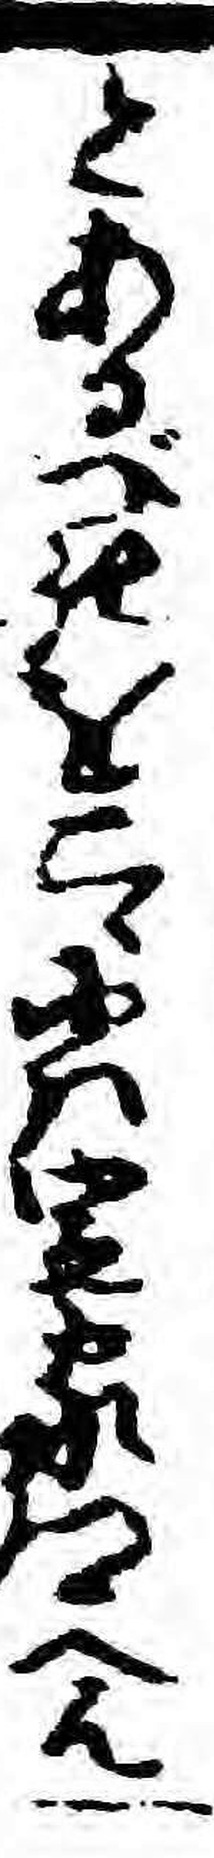とあるべきをこゝには定家わへん
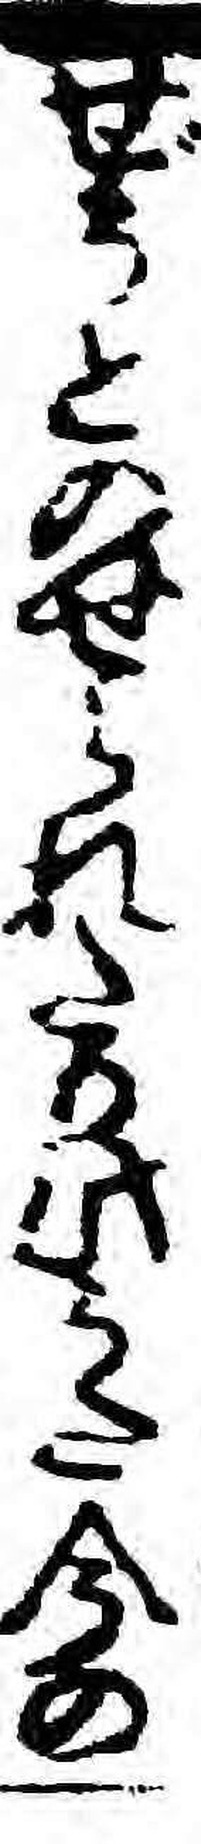ぜうとのせられたり此うた今の
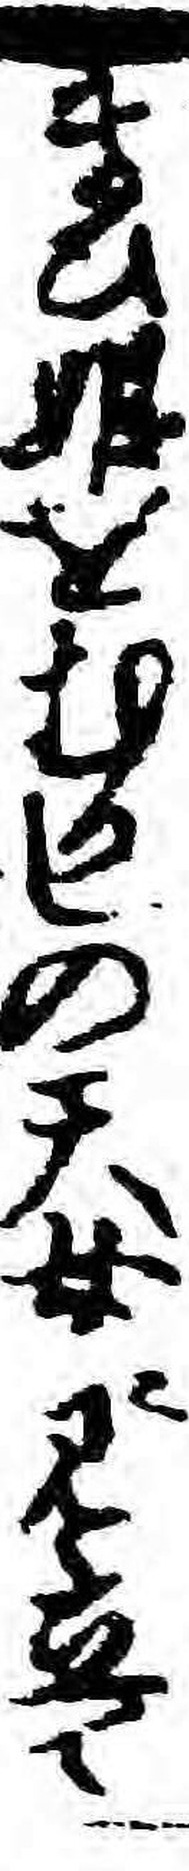まひ姫をむかしの天女に見立て
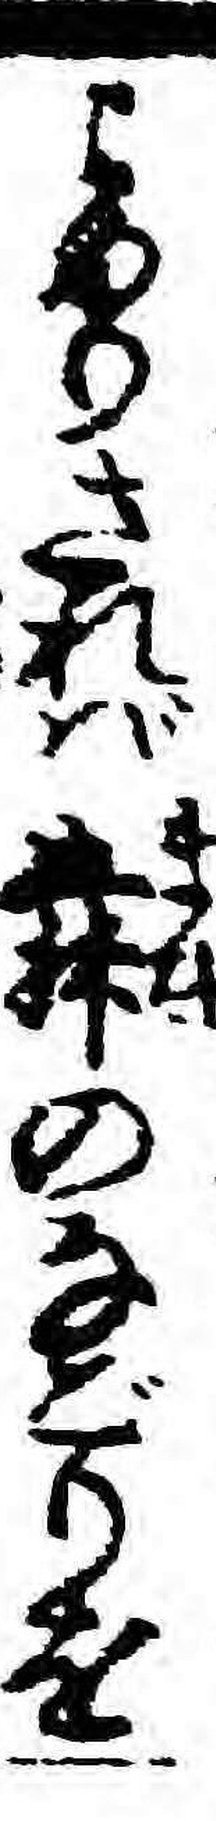よめりされは舞のなごりを
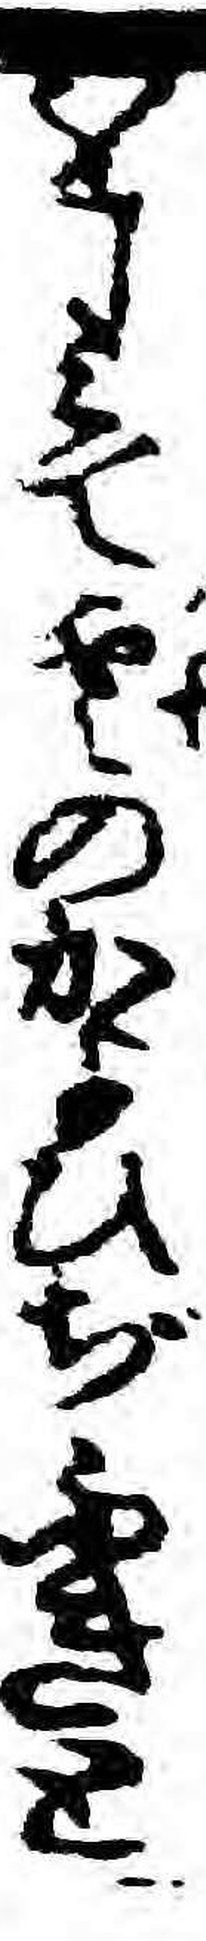をしみて雲のかよひぢふきと
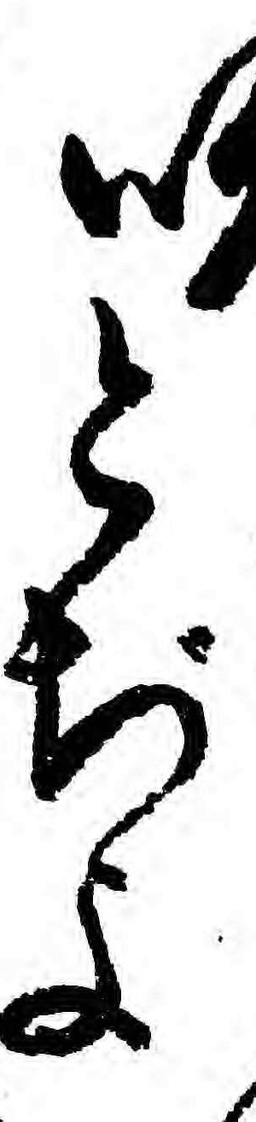吹とぢよ
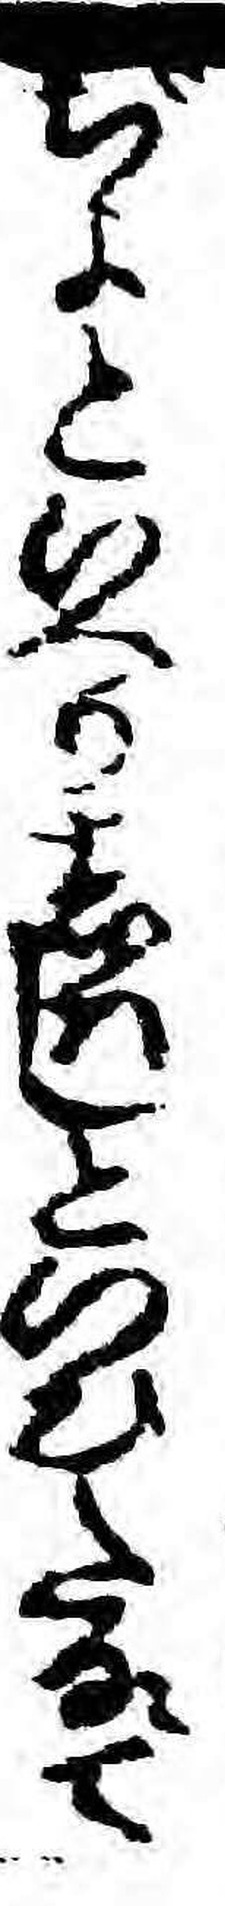ぢよといへりしはしといひたるにて
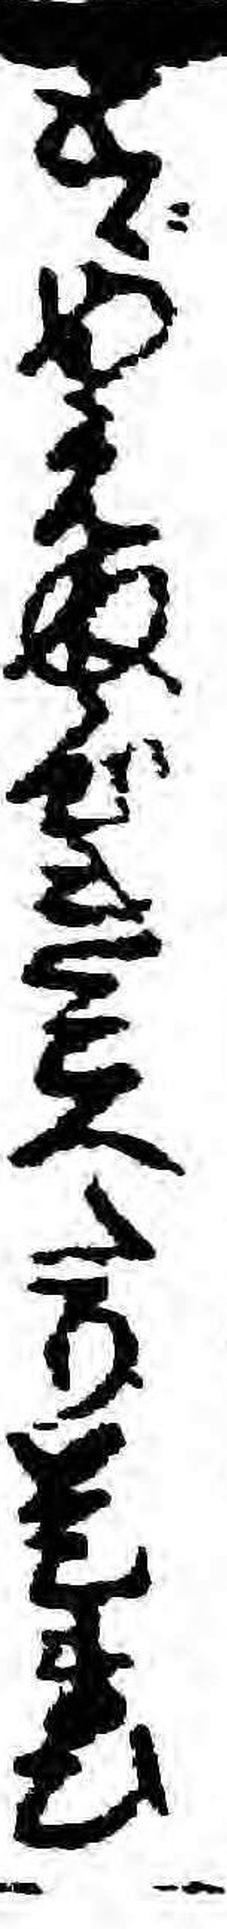とゞめえぬ心きこへたり是まひ
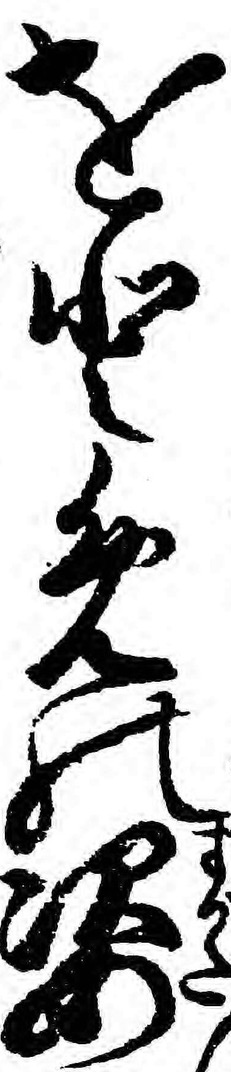をとめの姿
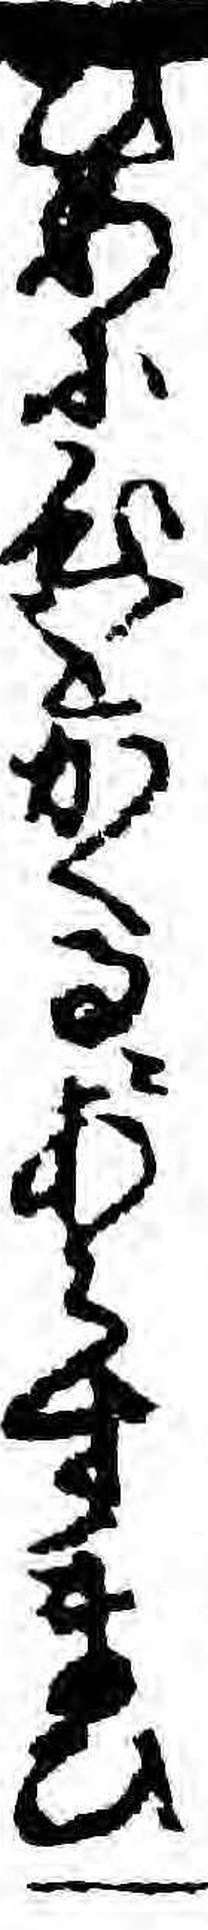ひめに心をかくるにあらすまひ
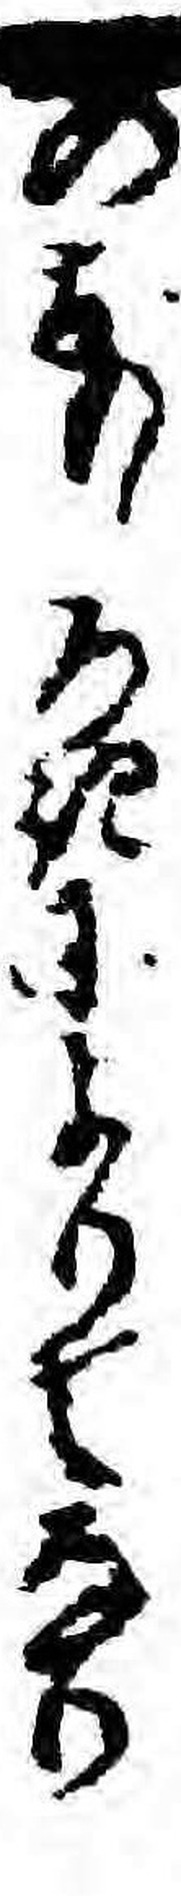のおもしろきによりてなり
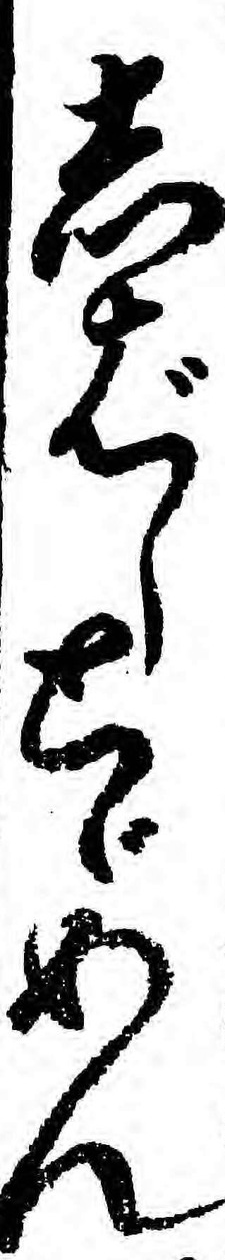しばしとゞめん
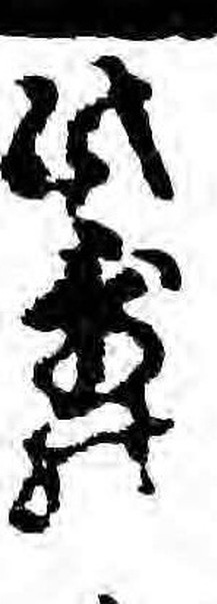此哥の
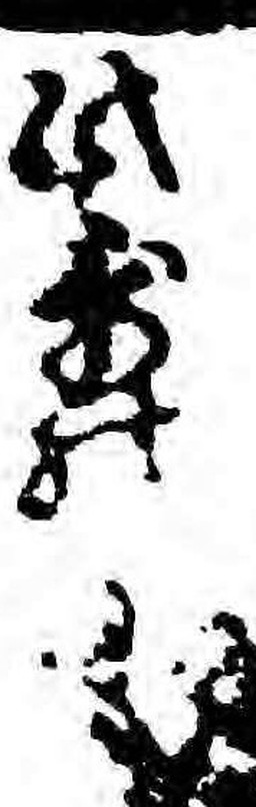此哥の
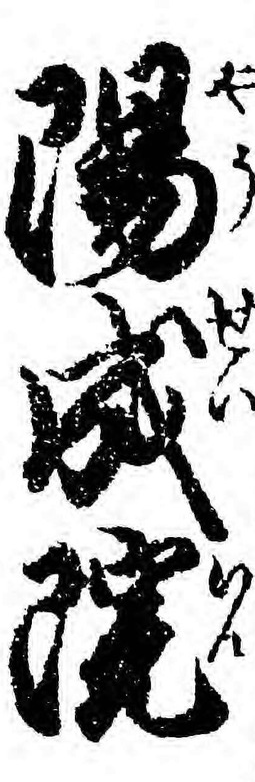陽成院
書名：頭書和歌注譯／壽賀多百人一首小倉錦
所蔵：国文学研究資料館
